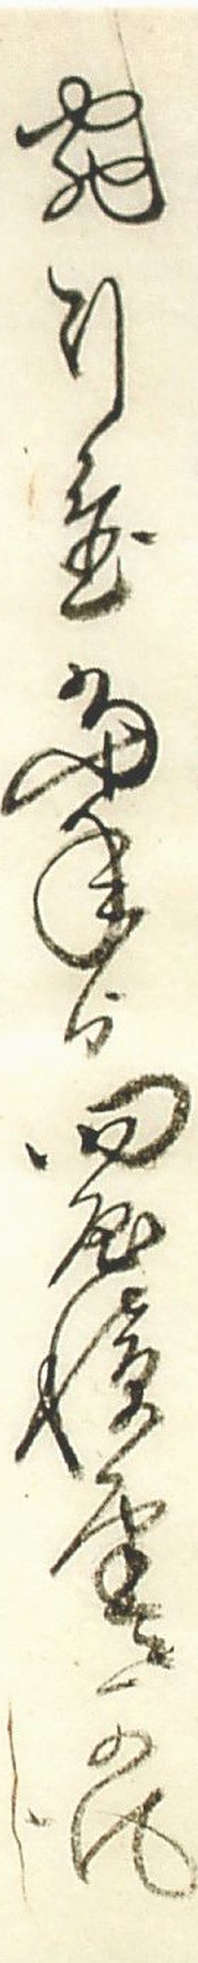宛引置当年ゟ問屋積金に可仕
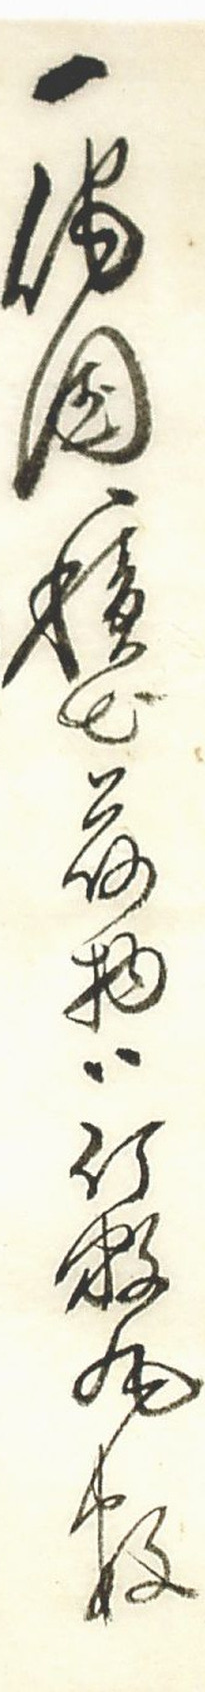一他国へ積出荷物は斤数丸数
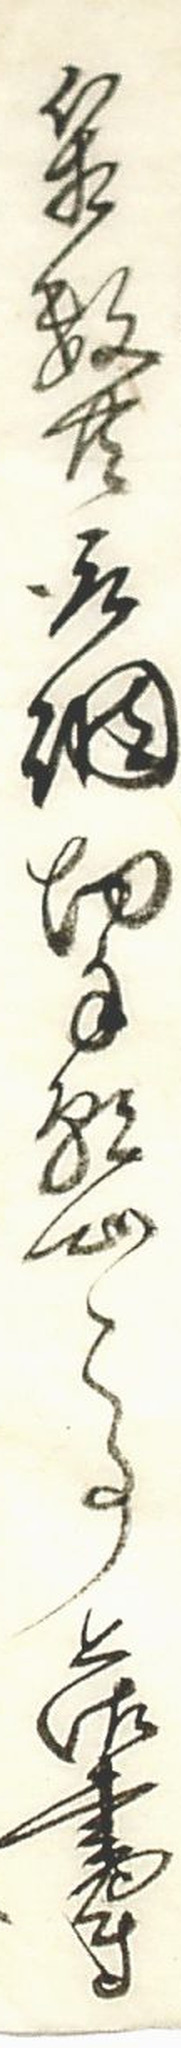箱数共取調切手願出候事と御書付
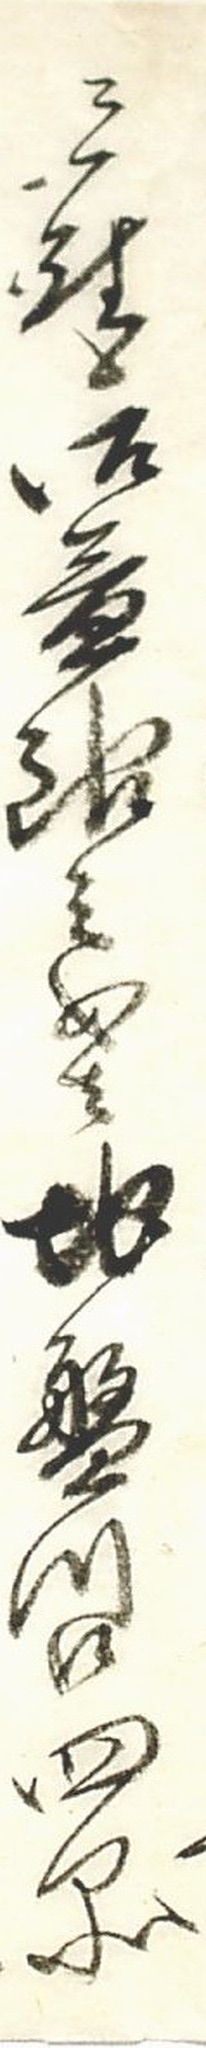に御座候御益銀之義は地盤川口四品
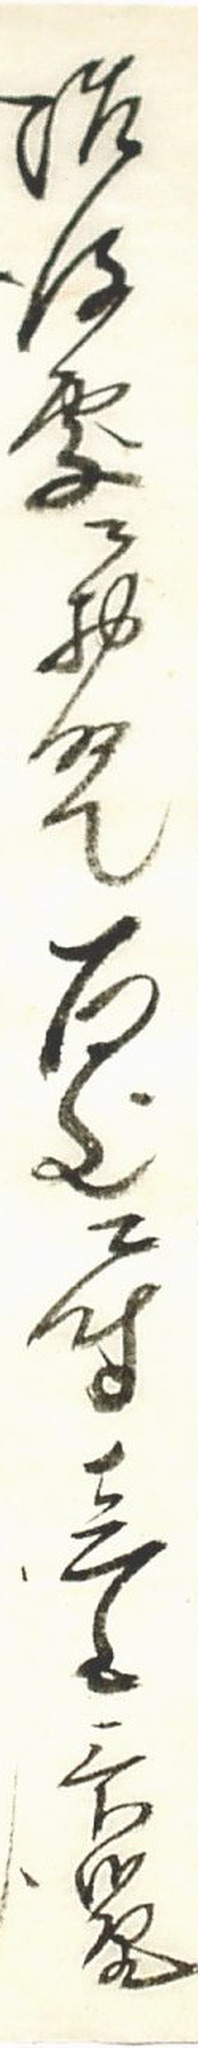御役処におゐて百匁に付壱匁三分弐厘
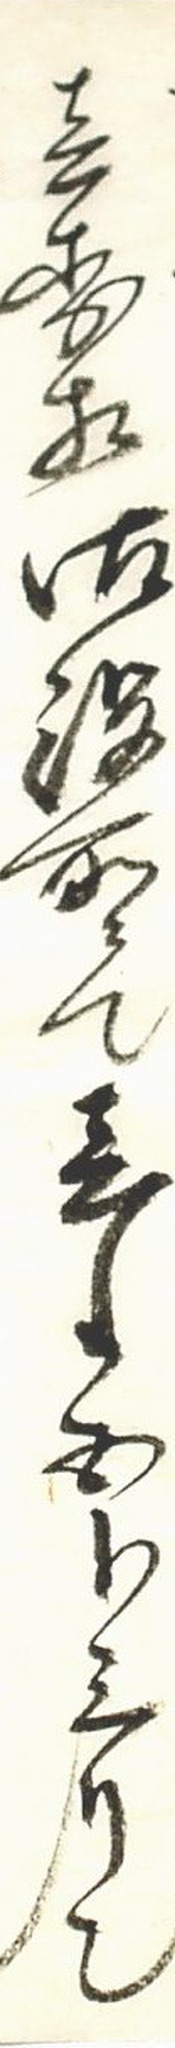壱歩相御役所にて壱匁五分三りん
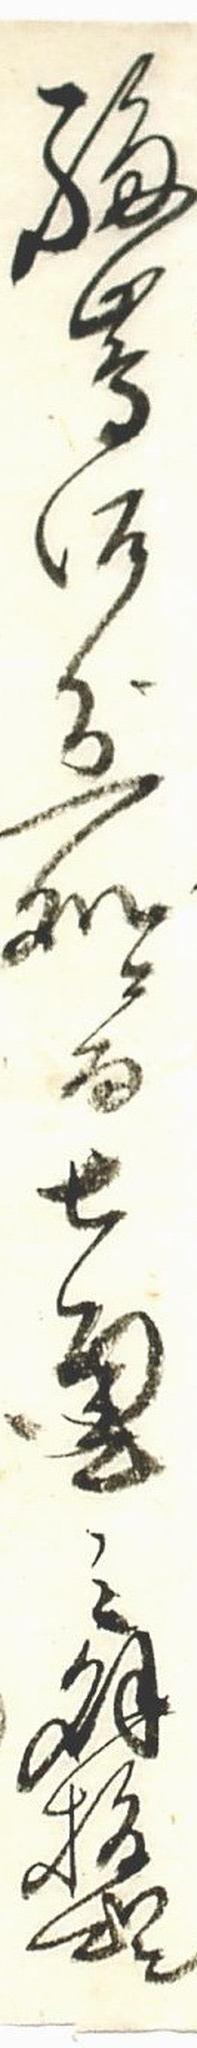福島御分一処にて七厘之外指出し
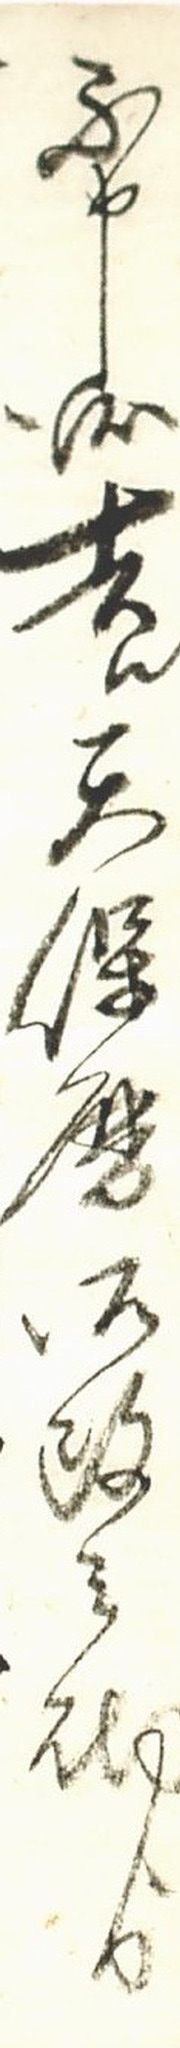不申所去る天保暦御改之砌ゟ
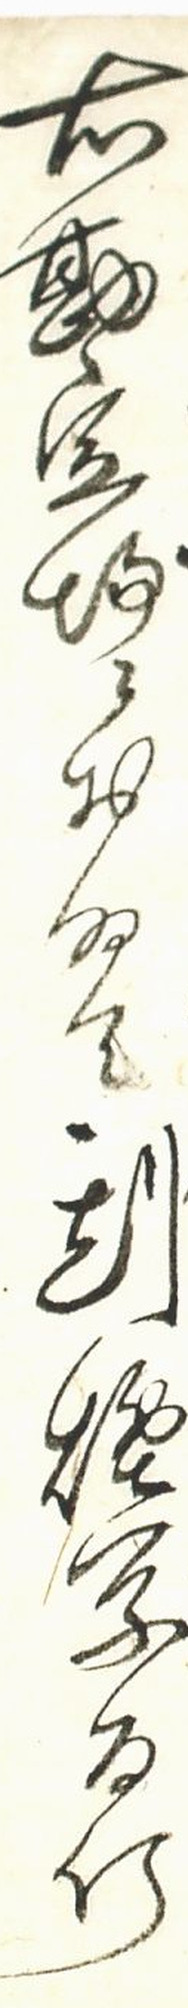右勘定場におゐて刻煙草百斤
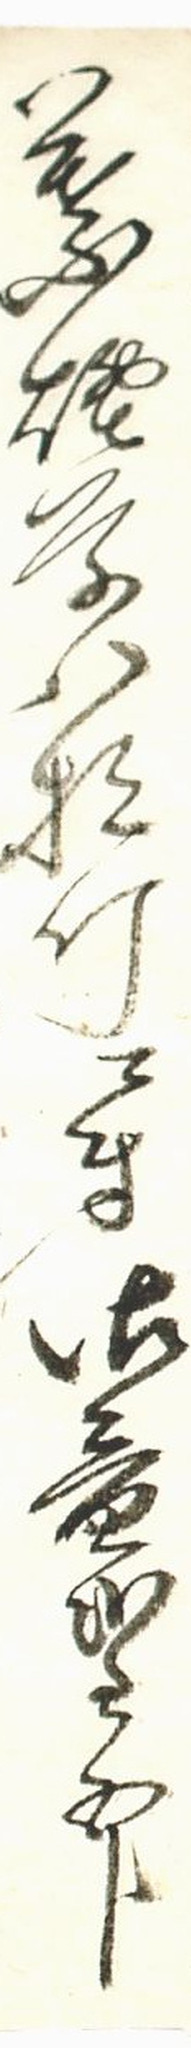葉煙草八拾斤に付御益弐匁五分
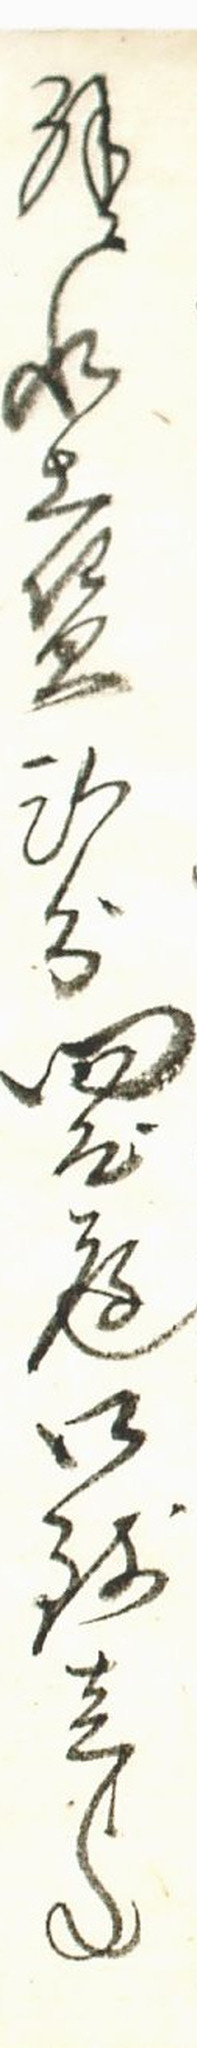外に水上賃弐分問屋庭口銭壱匁
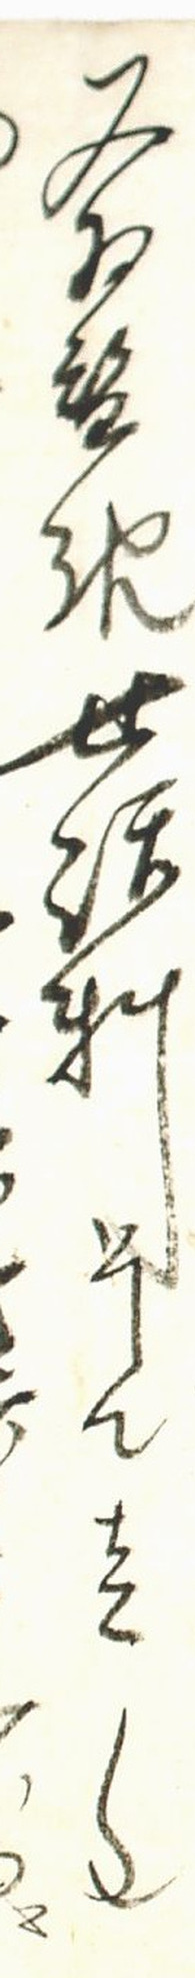又為替銀世話料として壱匁
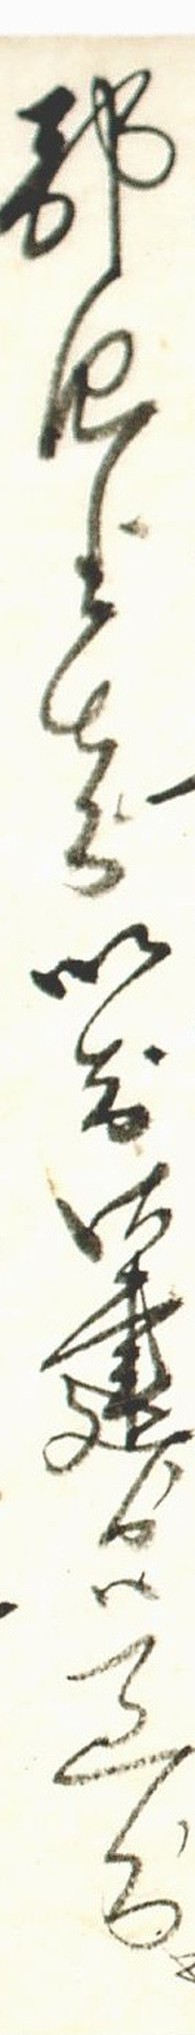都四匁七分以前御建ゟは過分に
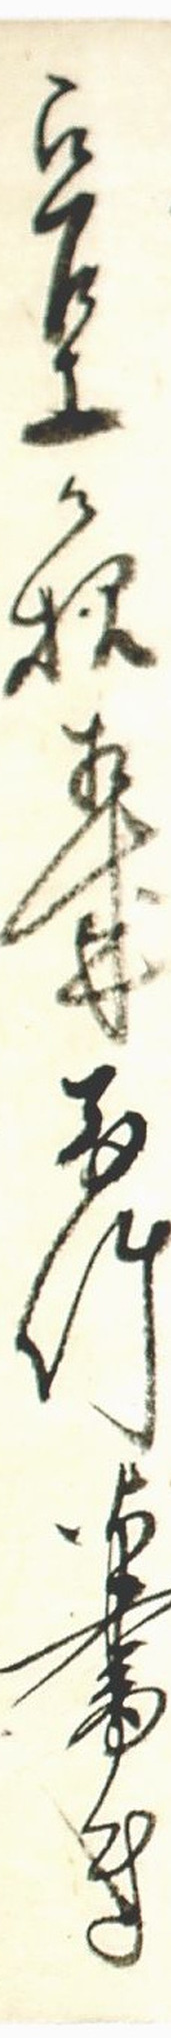被召上候様相成前件御書付
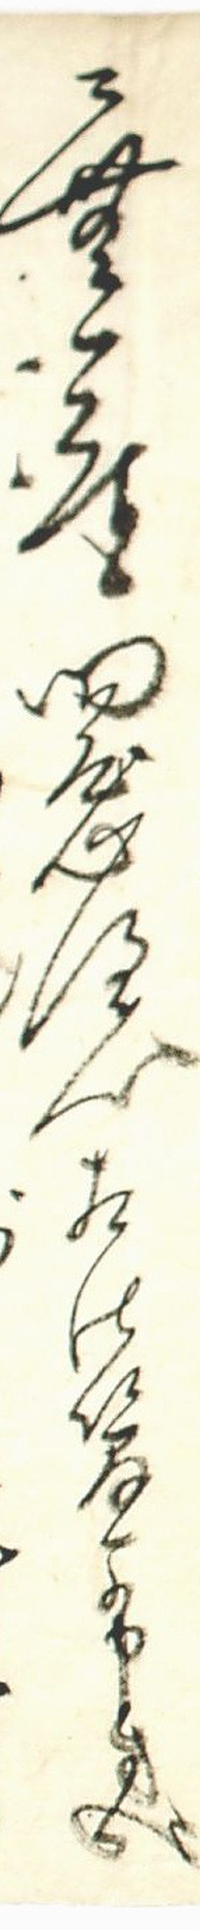に無御座候問屋心得を以相仕簡可申付哉
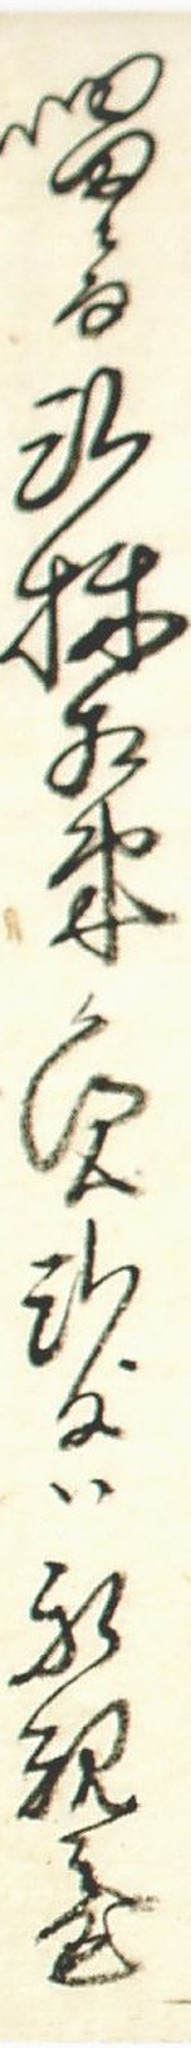唱にて弐株相束候得は弐匁は新規之懸
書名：煙草問屋扱方一件他
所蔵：鳴門教育大学 Naruto University of Education
